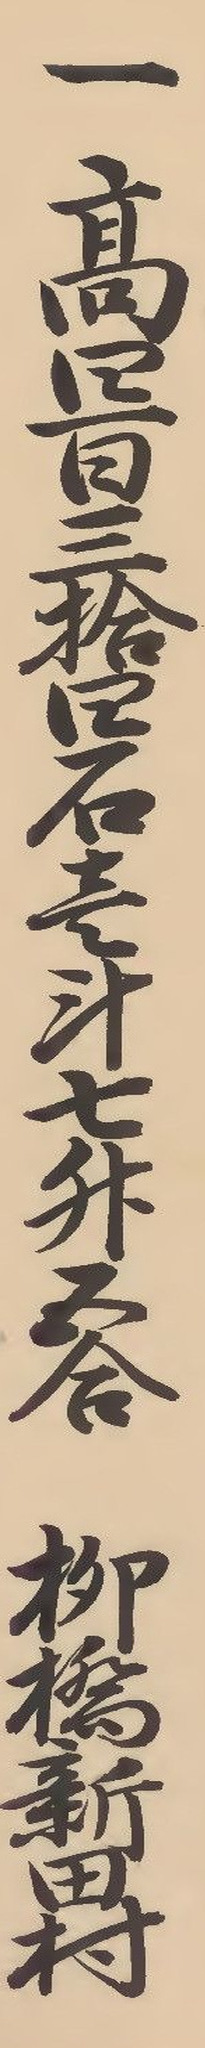一高四百三拾四石壱斗七升五合柳橋新田村
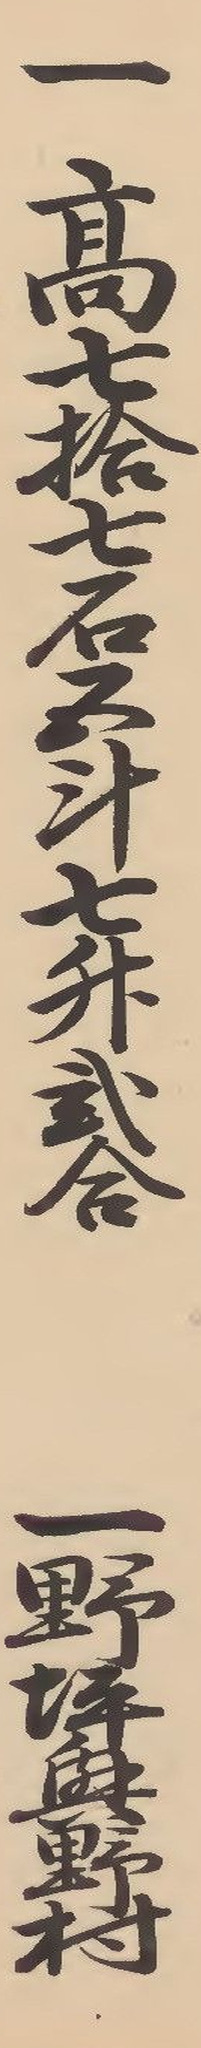一高七拾七石五斗七升弐合一野坪興野村
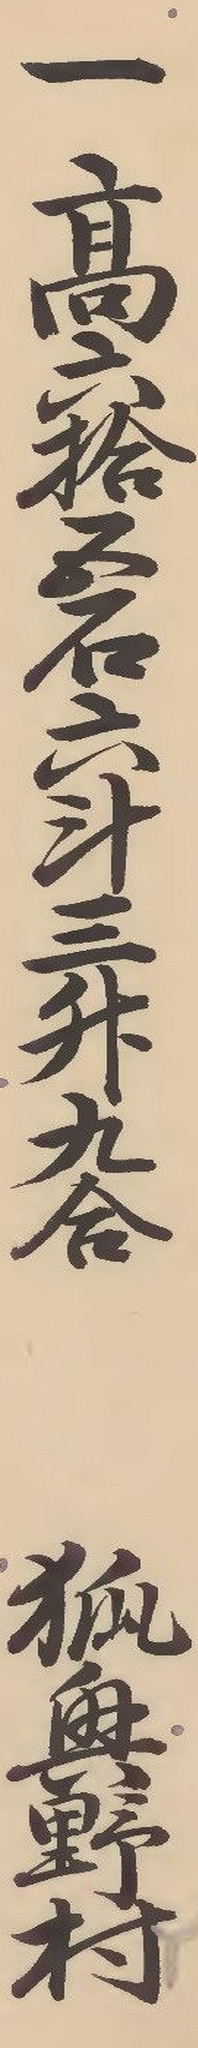一高六拾五石六斗三升九合狐興野村
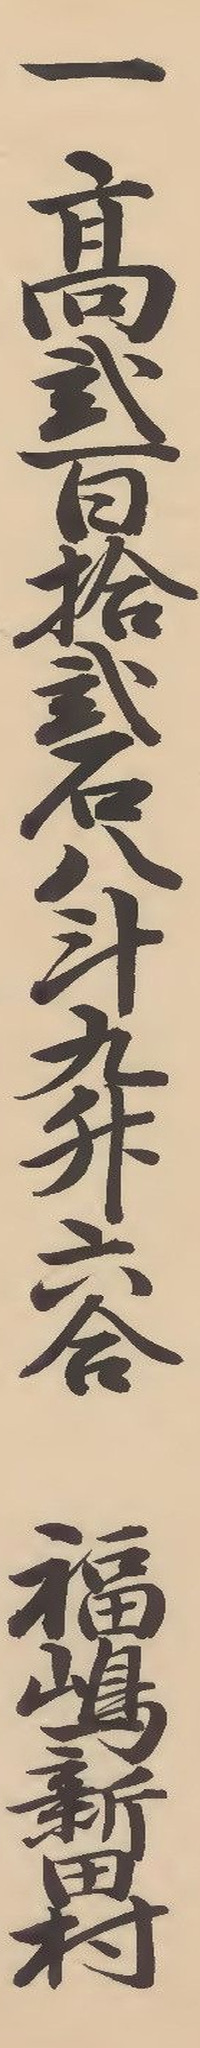一高弐百拾弐石八斗九升六合福島新田村
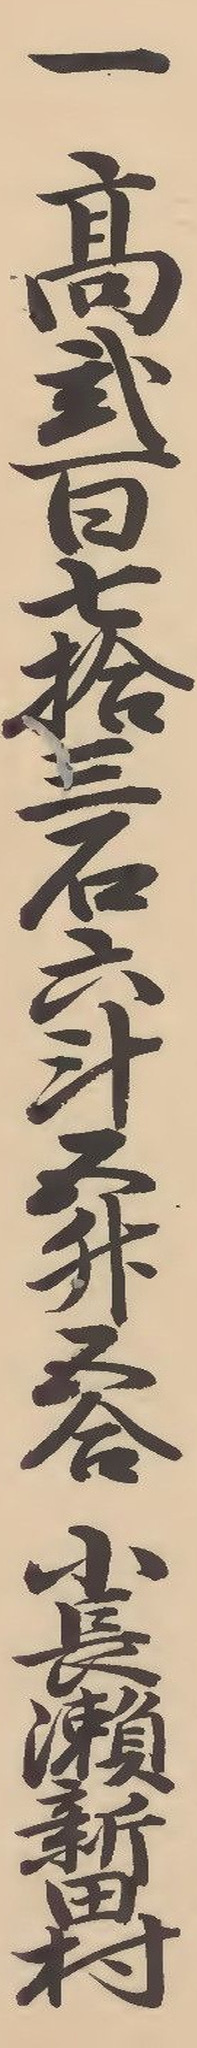一高弐百七拾三石六斗五升五合小長瀬新田村

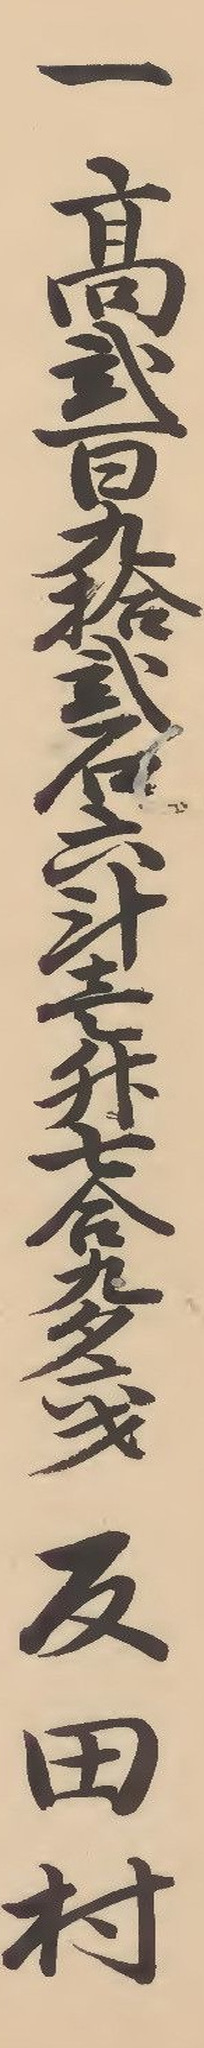一高弐百九拾弐石六斗壱升七合九勺六才反田村
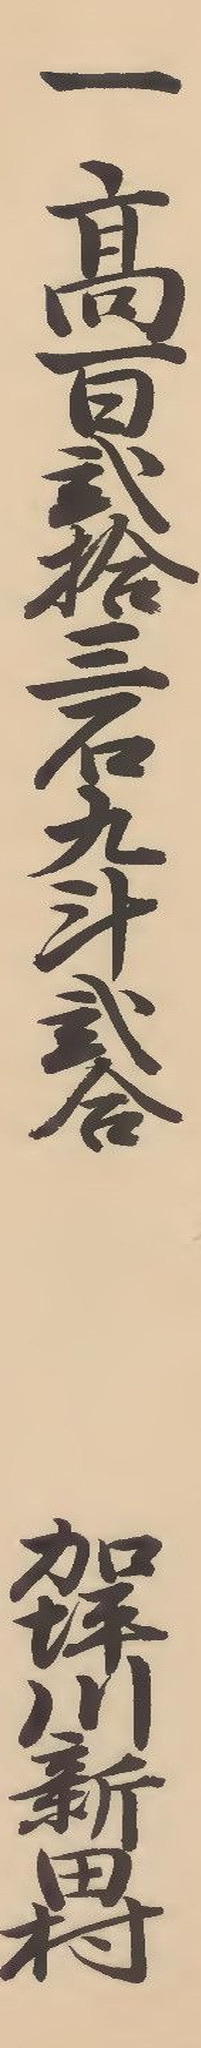一高百弐拾三石九斗弐合加坪川新田村
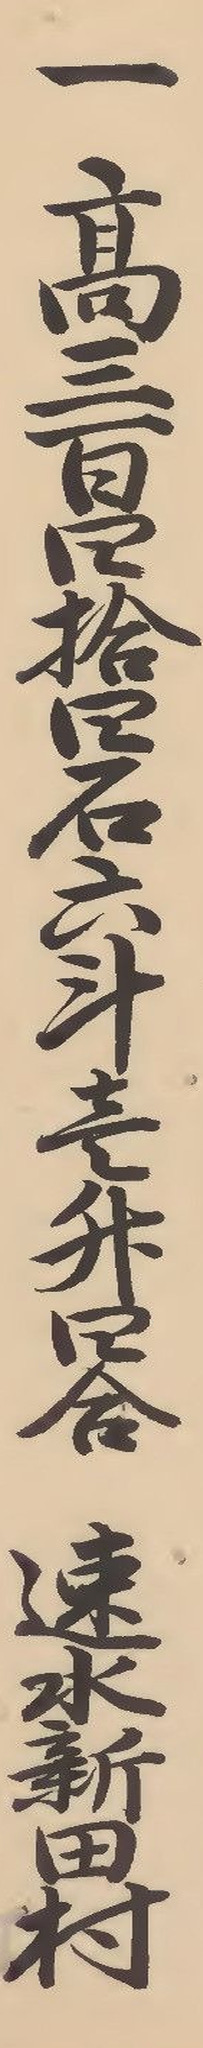一高三百四拾四石六斗壱升四合速水新田村
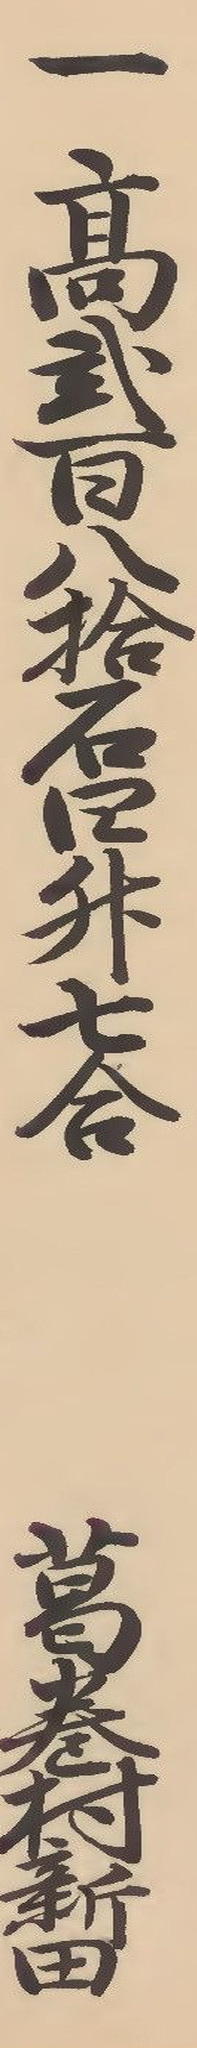一高弐百八拾石四升七合葛巻村新田
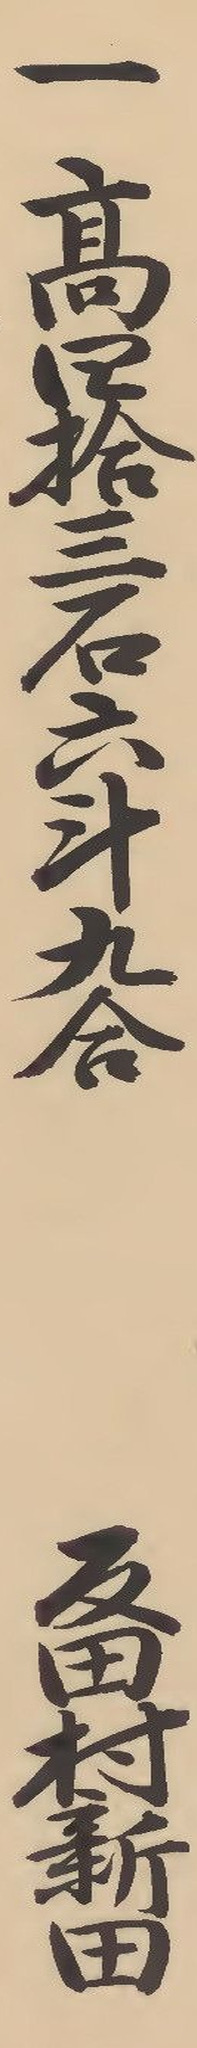一高四拾三石六斗九合反田村新田
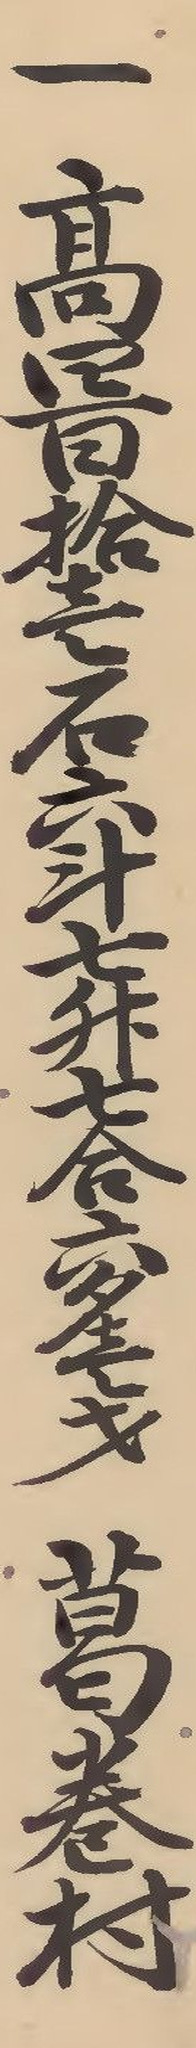一高四百拾壱石六斗七升七合六勺壱才葛巻村
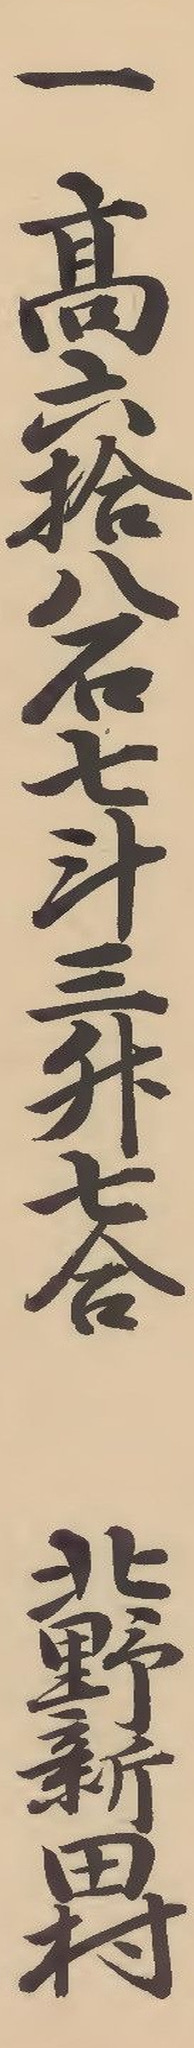一高六拾八石七斗三升七合北野新田村
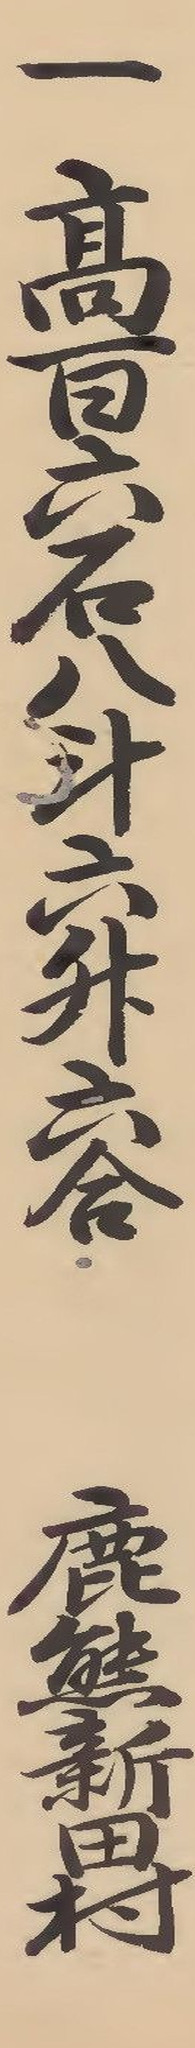一高百六石八斗六升六合鹿熊新田村

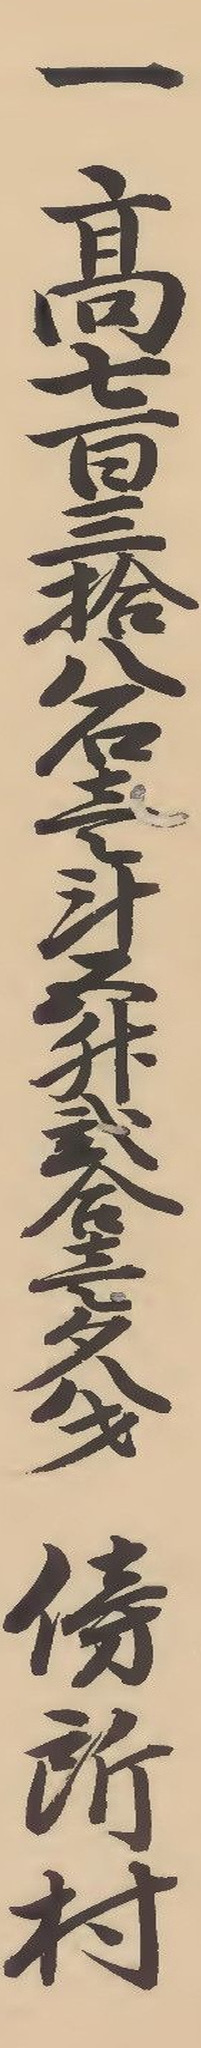一高七百三拾八石壱斗五升弐合壱勺八才傍所村
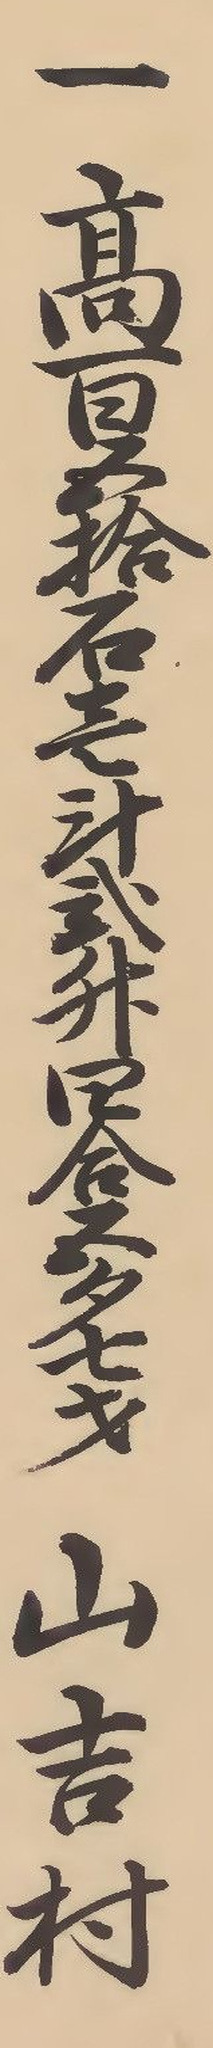一高百五拾石壱斗弐升四合五勺七才山吉村
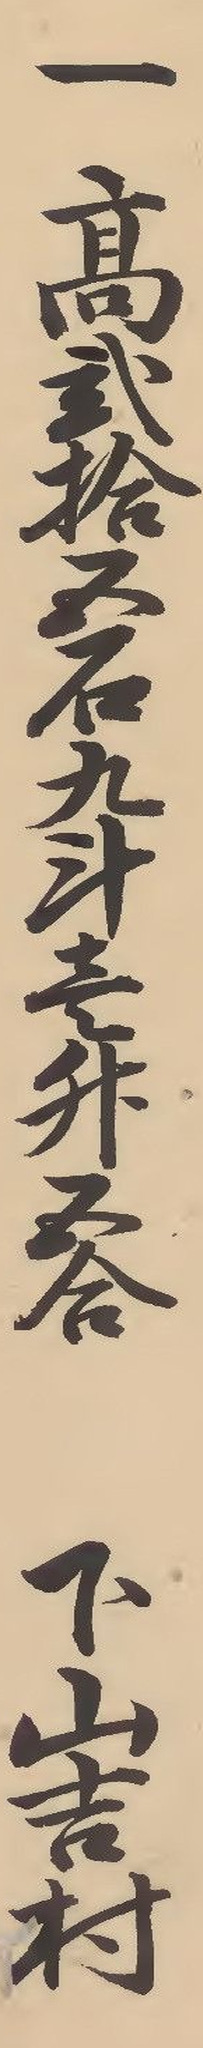一高弐拾五石九斗壱升五合下山吉村
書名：越後国郷帳　下
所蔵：国立公文書館 National Archives of Japan
